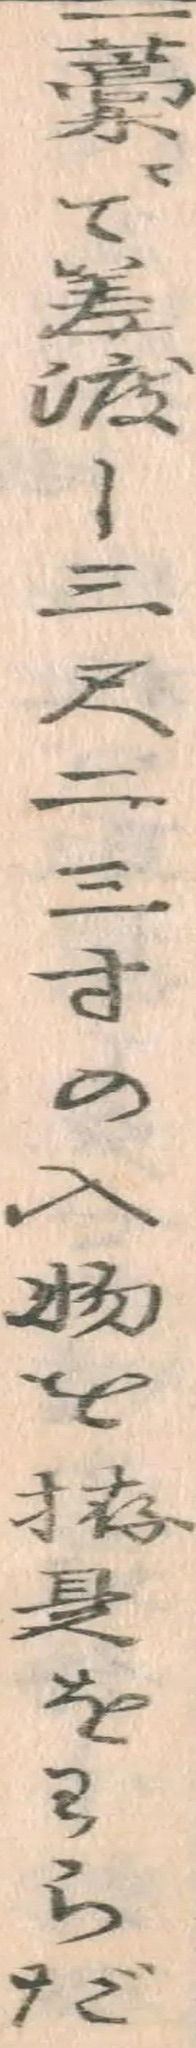一藁にて差渡し三尺二三寸の入物を拵是をわらだ
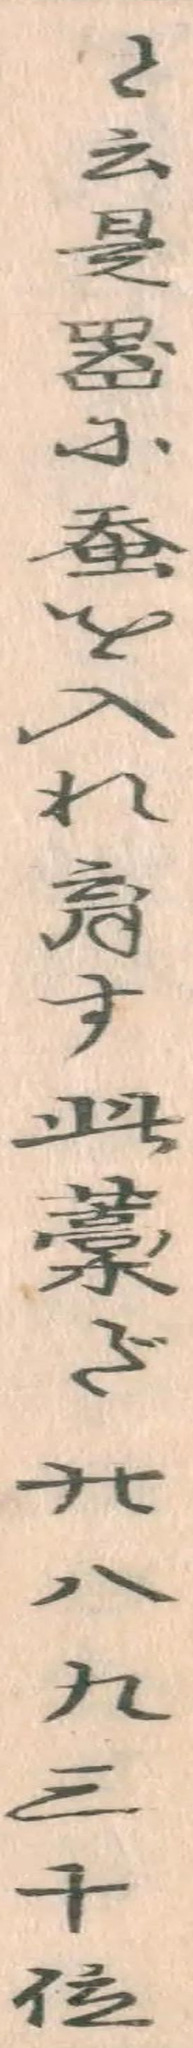と云是器に蚕を入れ育す此藁だ廿八九三十位
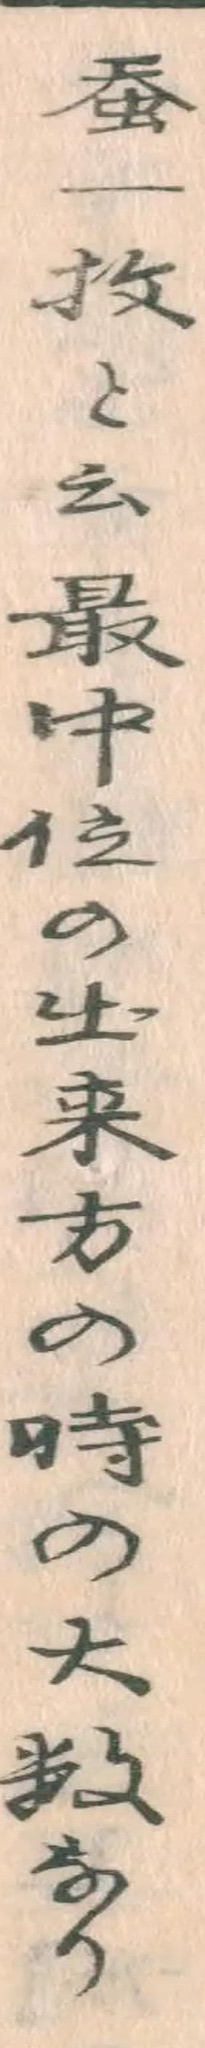蚕一枚と云最中位の出来方の時の大数なり
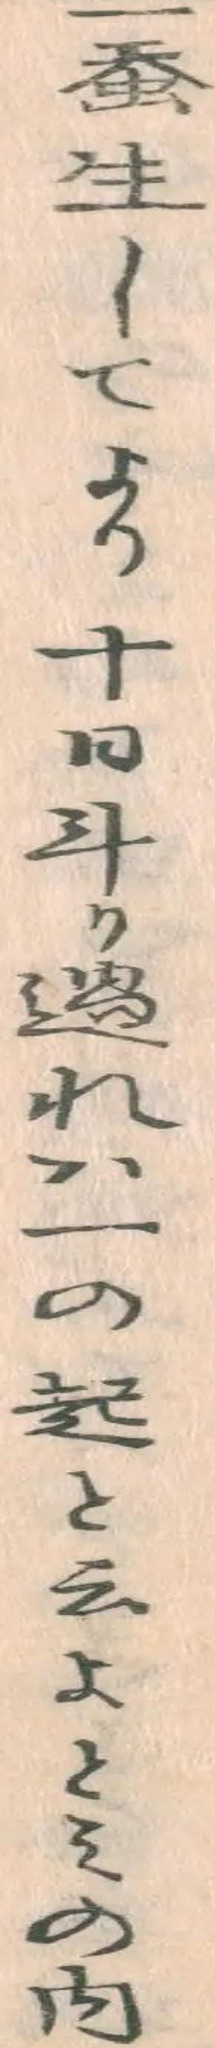一蚕生してより十日斗り過れは一の起と云よとみの内
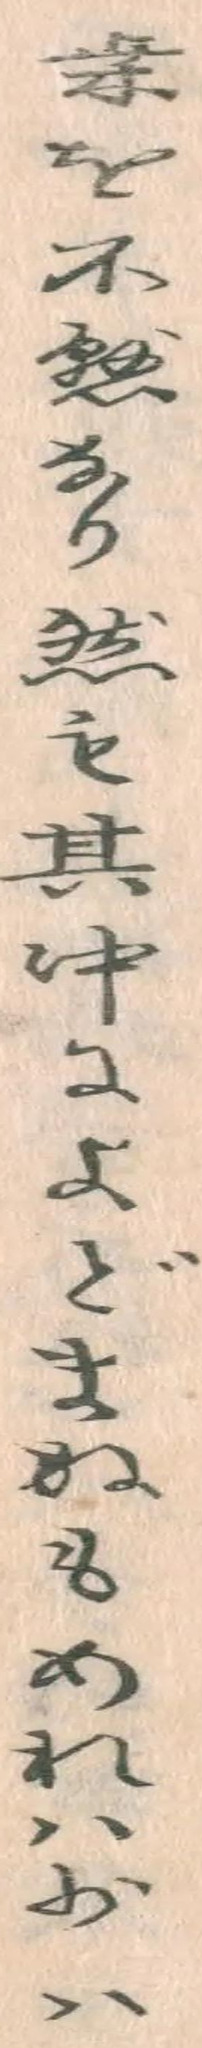桑を不懸なり然も其中によどまぬもあれは少は
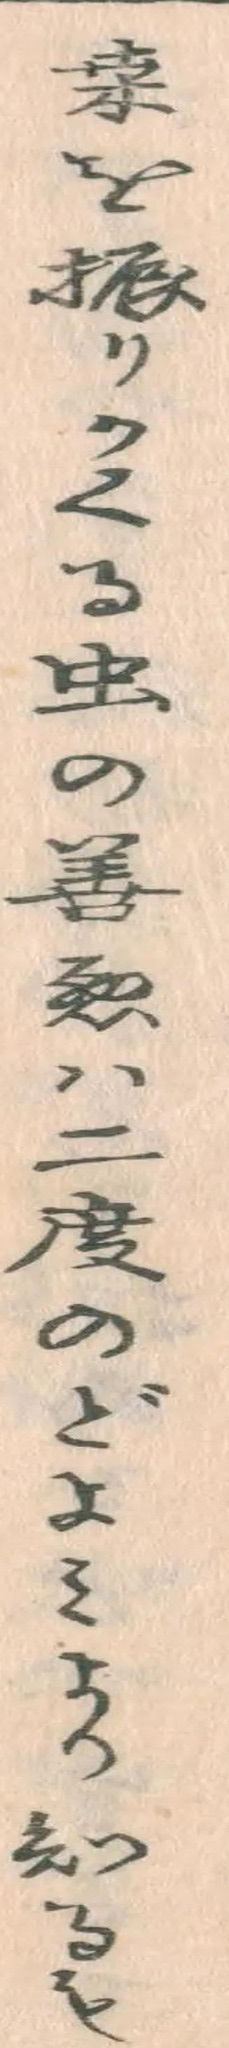桑を振りかくる虫の善悪は二度のどよみより知るも
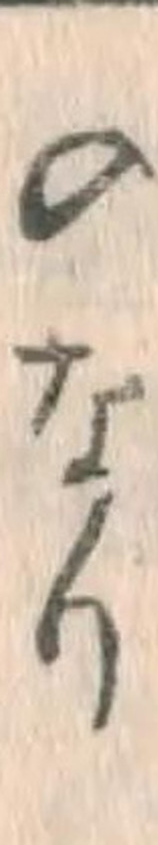のなり
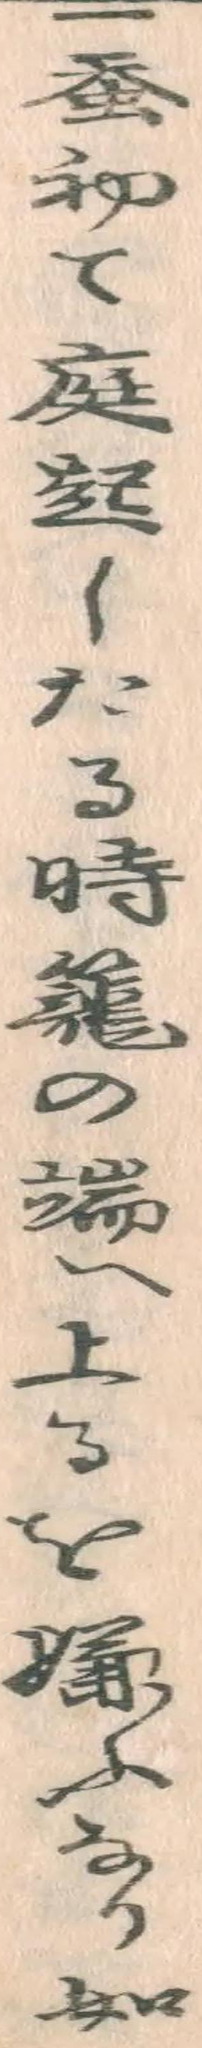一蚕初て庭起したる時籠の端へ上るを嫌ふなり如
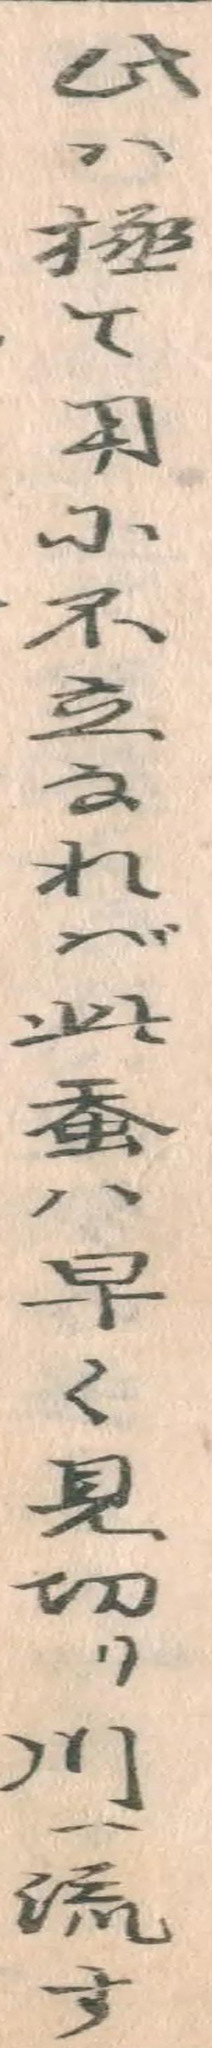此は極て用に不立なれば此蚕は早く見切り川へ流す
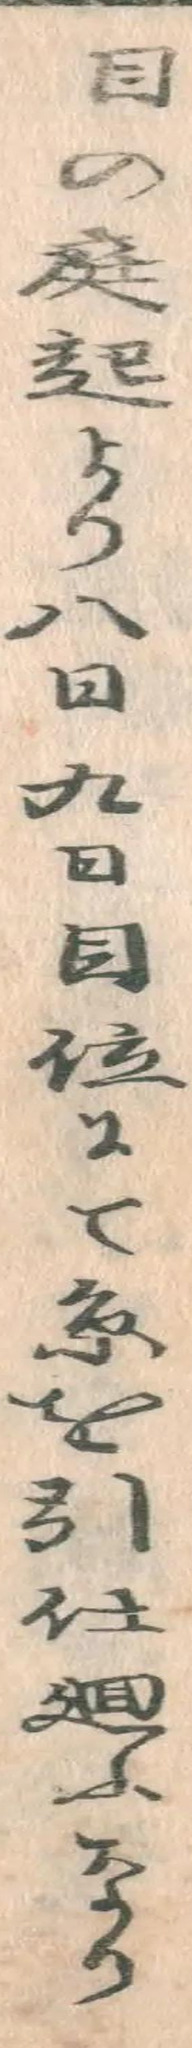目の庭起より八日九日目位にて糸を引仕廻ふなり
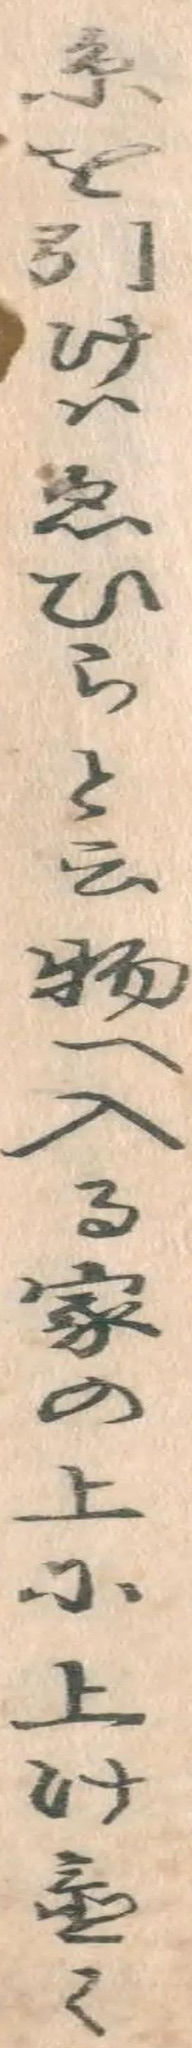糸を引けはゑひらと云物へ入る家の上に上け置く
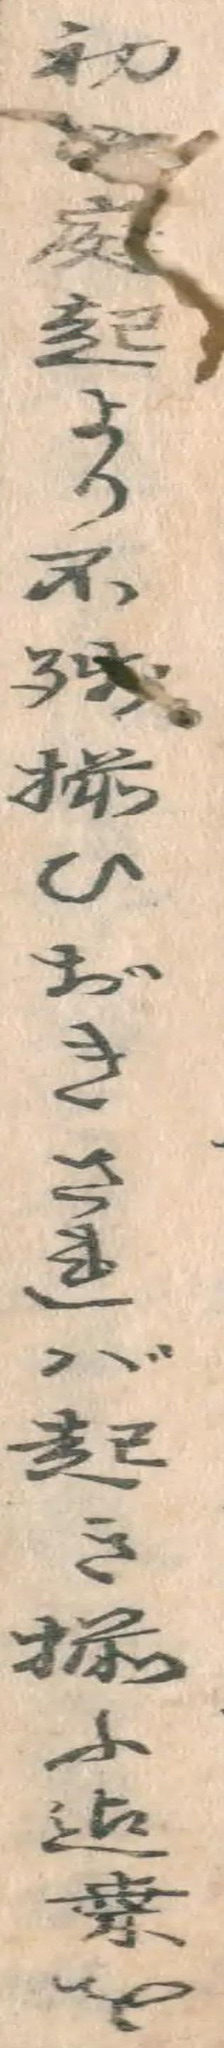初の庭起より不残揃ひおきされば起き揃ふ迄桑を

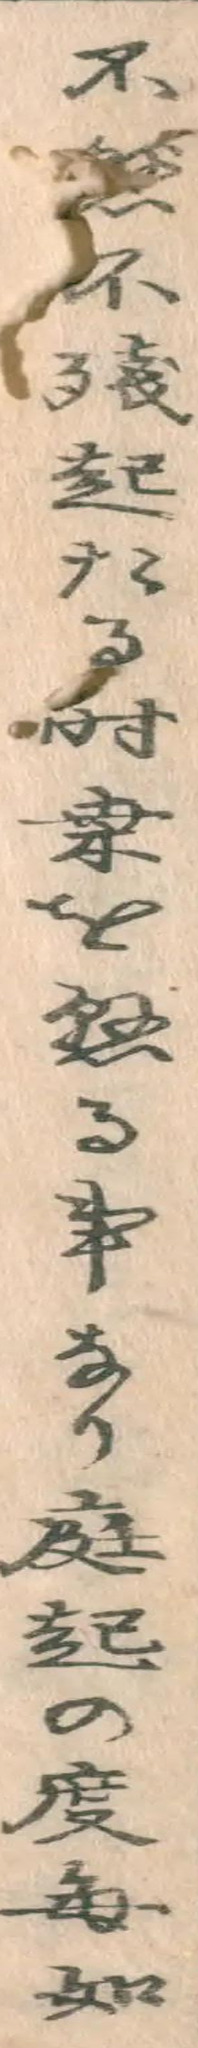不懸不残起たる時桑を懸る事なり庭起の度毎如
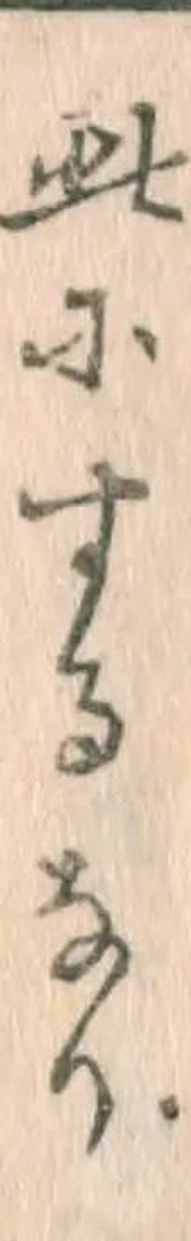此にするなり
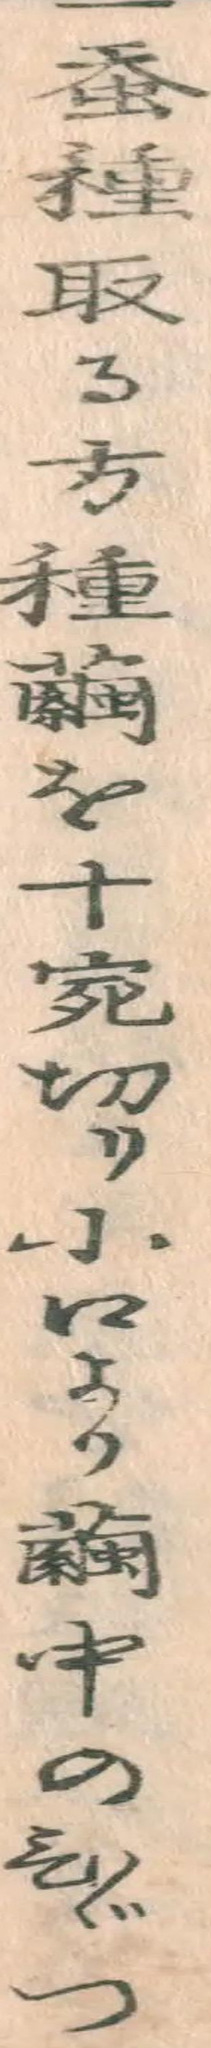一蚕種取る方種繭を十宛切り小口より繭中のひゞつ
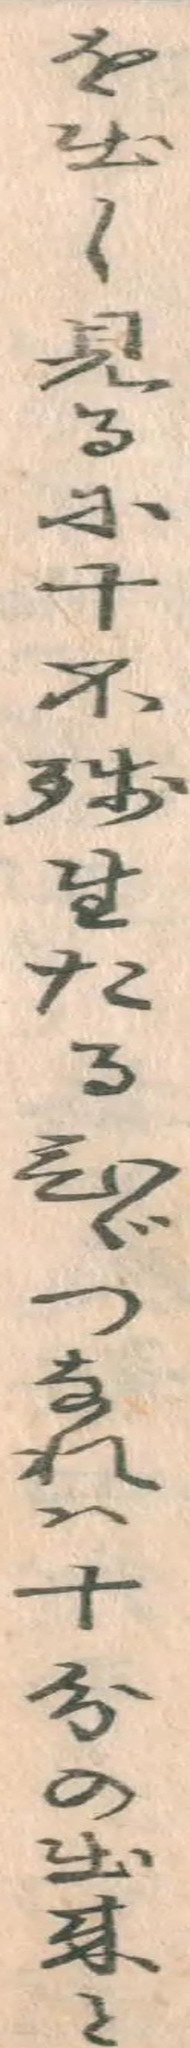を出し見るに十不残生たるひゞつなれは十分の出来と
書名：機織彙編 5巻. [1]
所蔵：国立国会図書館 National Diet Library, JAPAN
